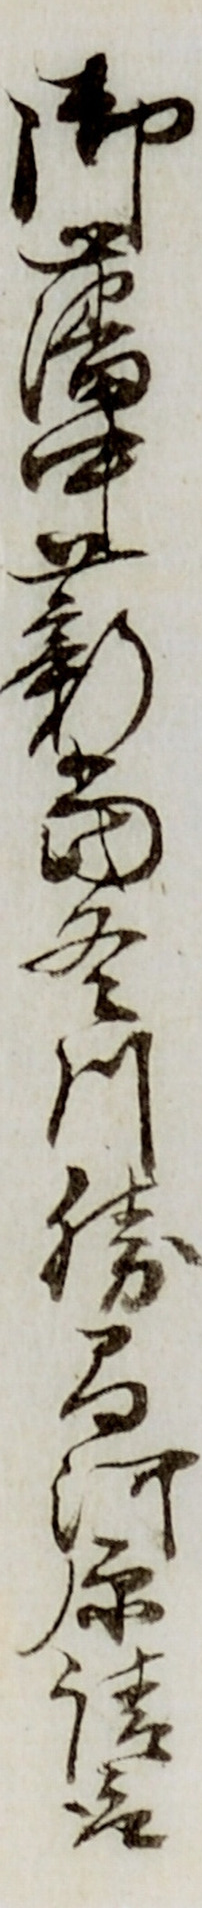御藩中薪当冬川勝間河原請取
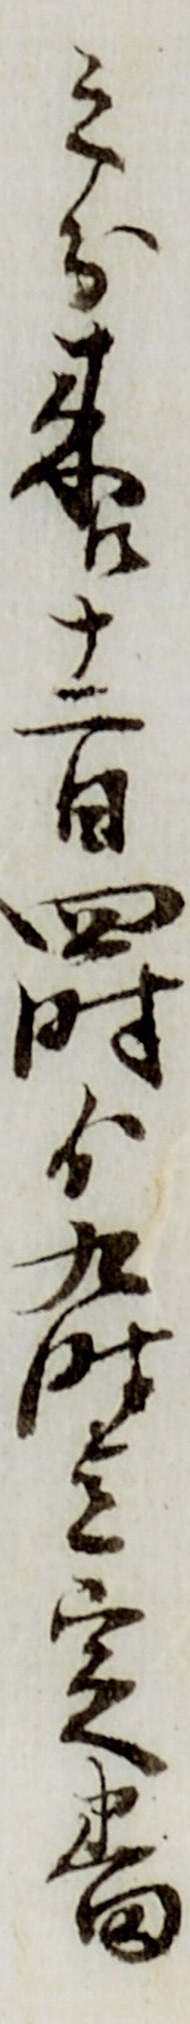之分来ル十二日四時ゟ九時迄定番
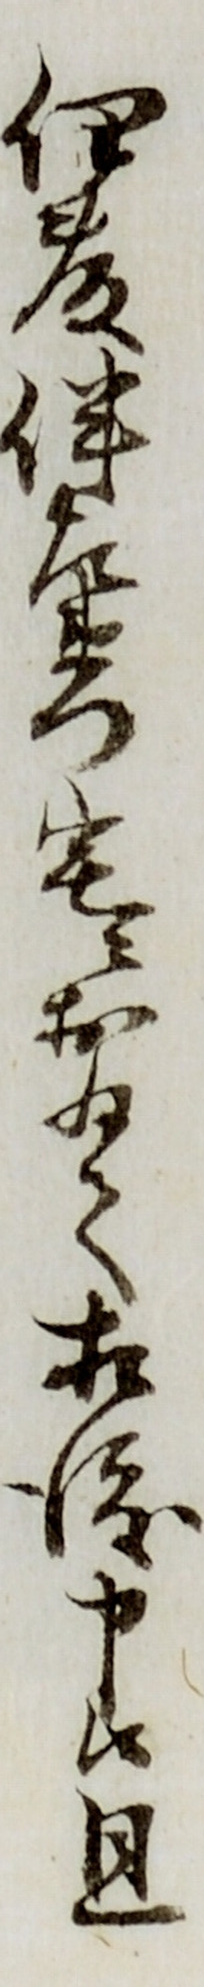伊藤伴左衛門宅におゐて相渡申候且
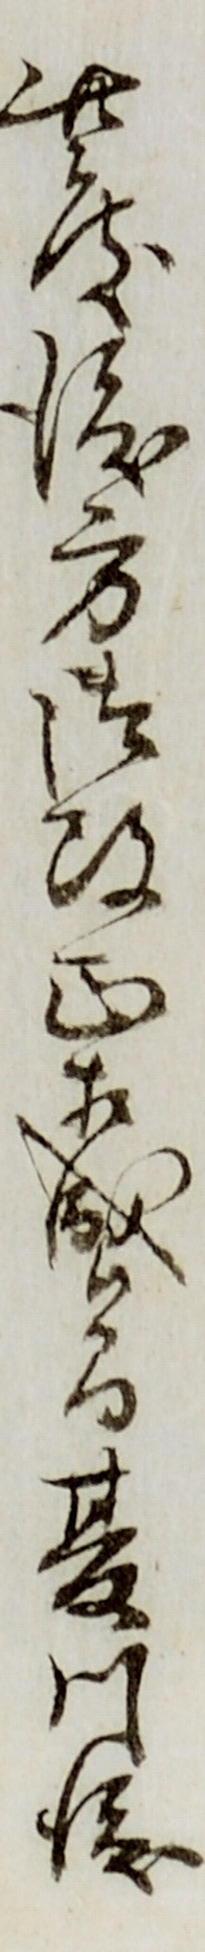此度渡方御改正相成候間夏川渡
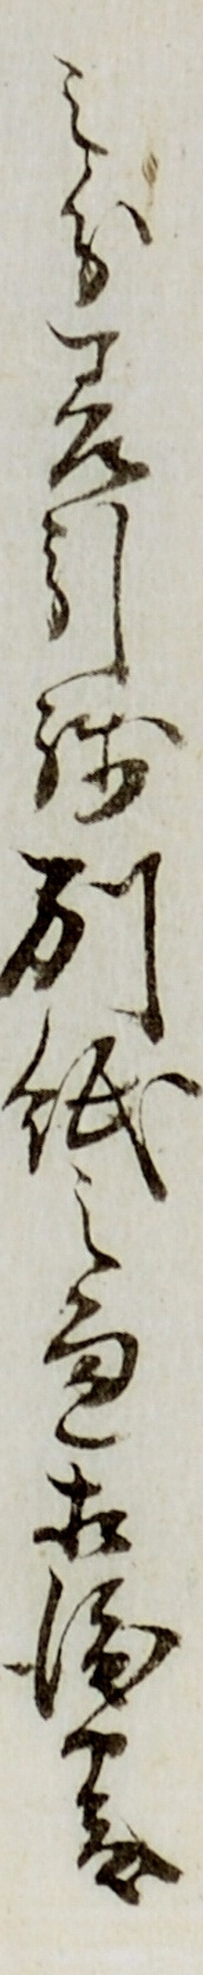之分差引残別紙之通相渡申度
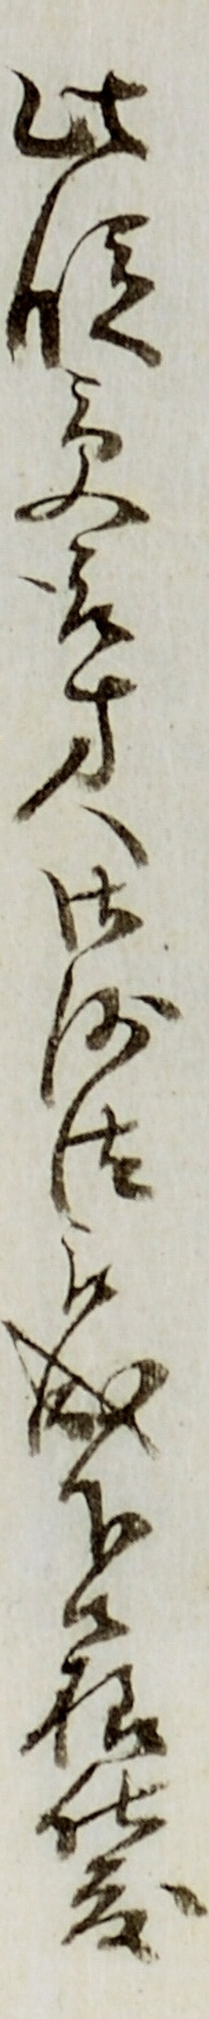此段受取方へ御沙汰被成下候様仕度
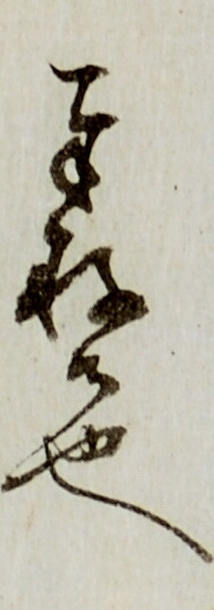奉存候也
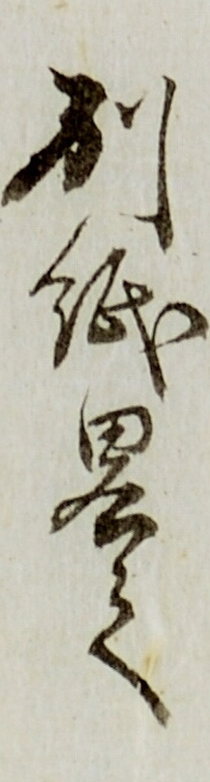別紙略之
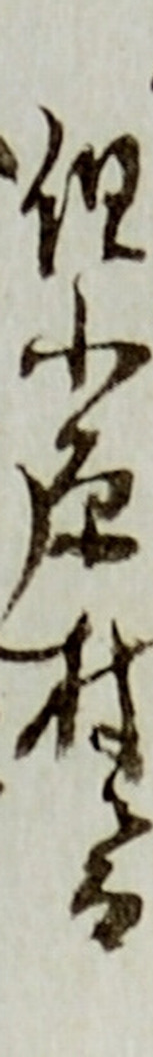但小原村にて
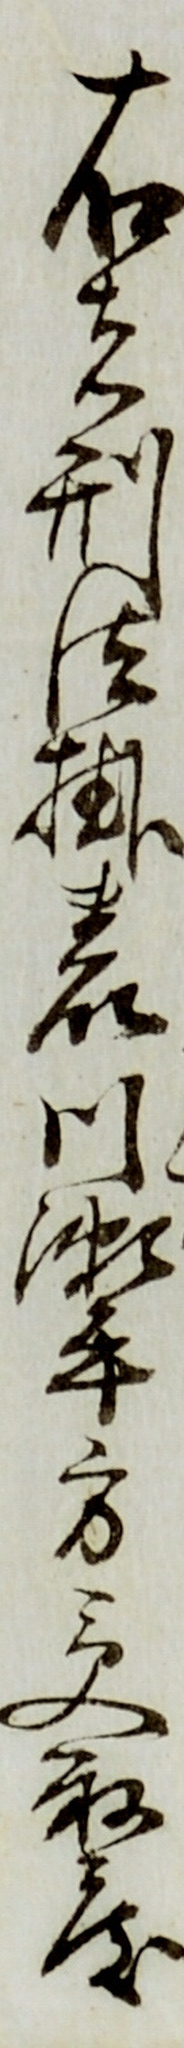右は刑法掛表川瀬平方受取度
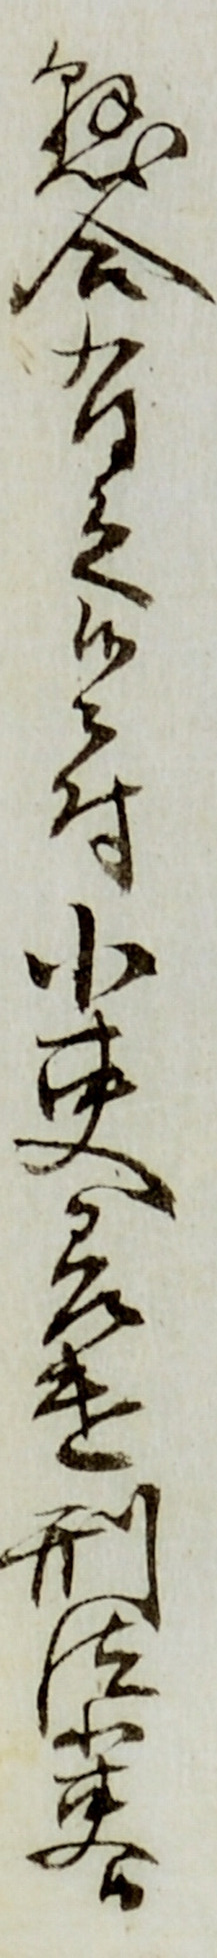懸合有之候に付小使差遣刑法小吏え
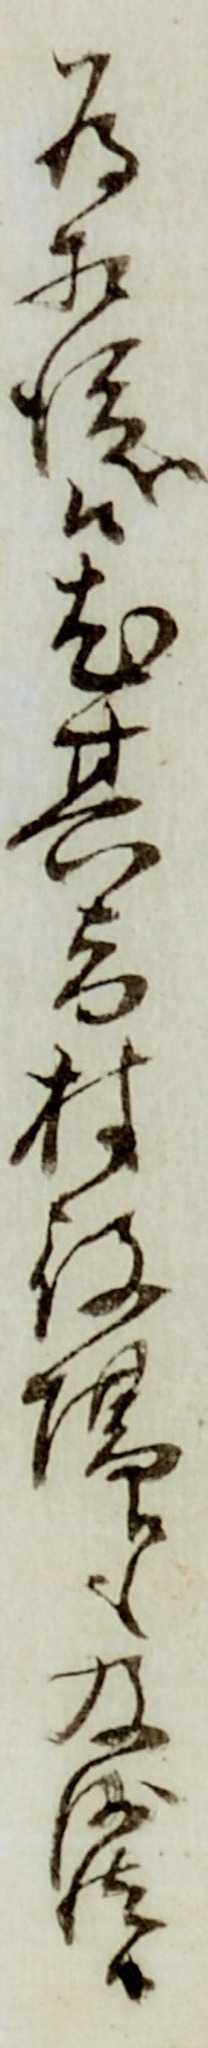為相渡候尤其旨村役場えも及沙汰候
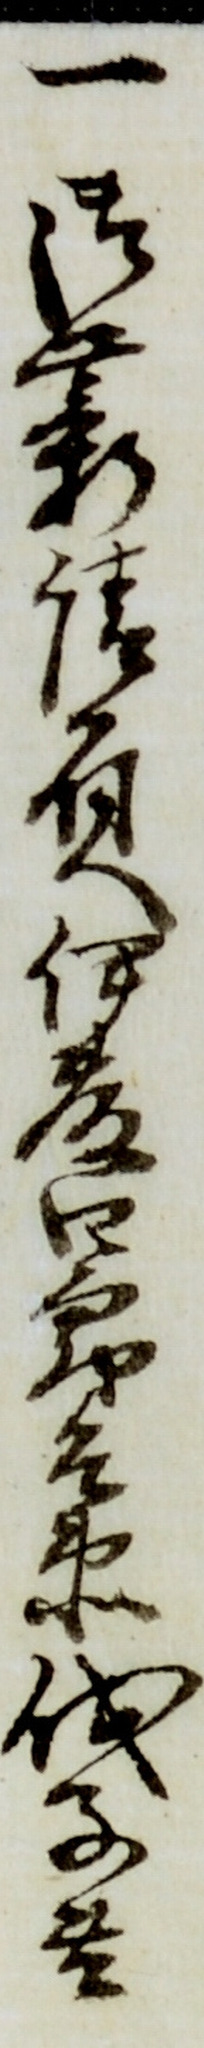一御薪請負伊藤四郎兵衛伐子共
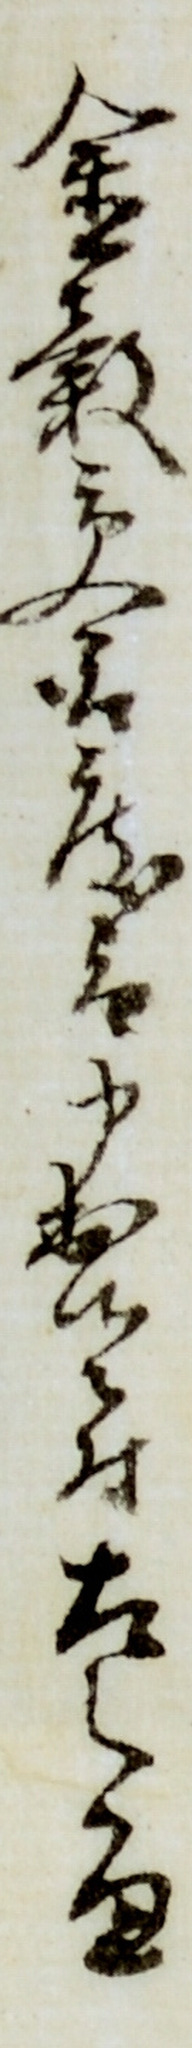金穀受取度旨申出候に付左之通

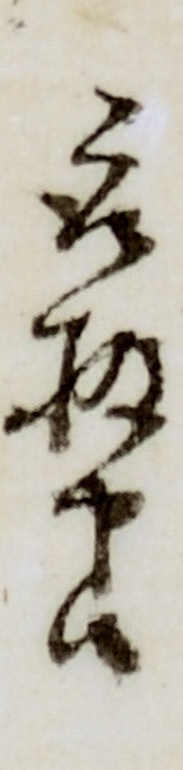取扱申候
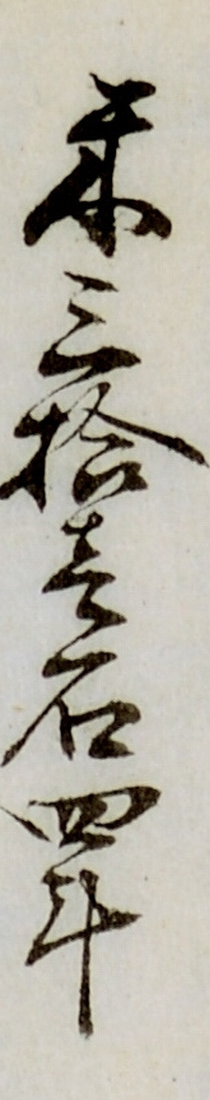米三拾壱石四斗
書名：山林方諸事御用留
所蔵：伊那市立高遠町図書館・合同会社AMANE
